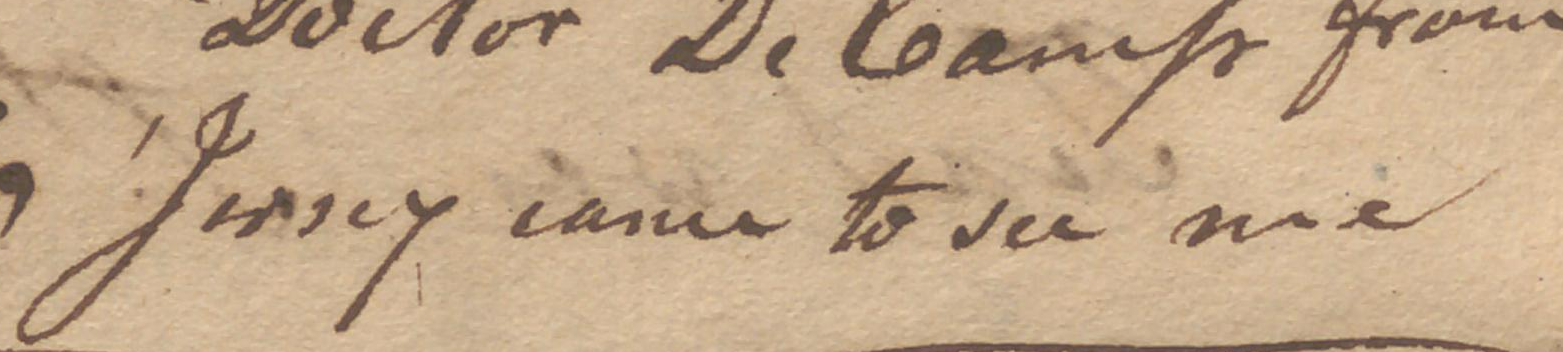Jersey came to see me
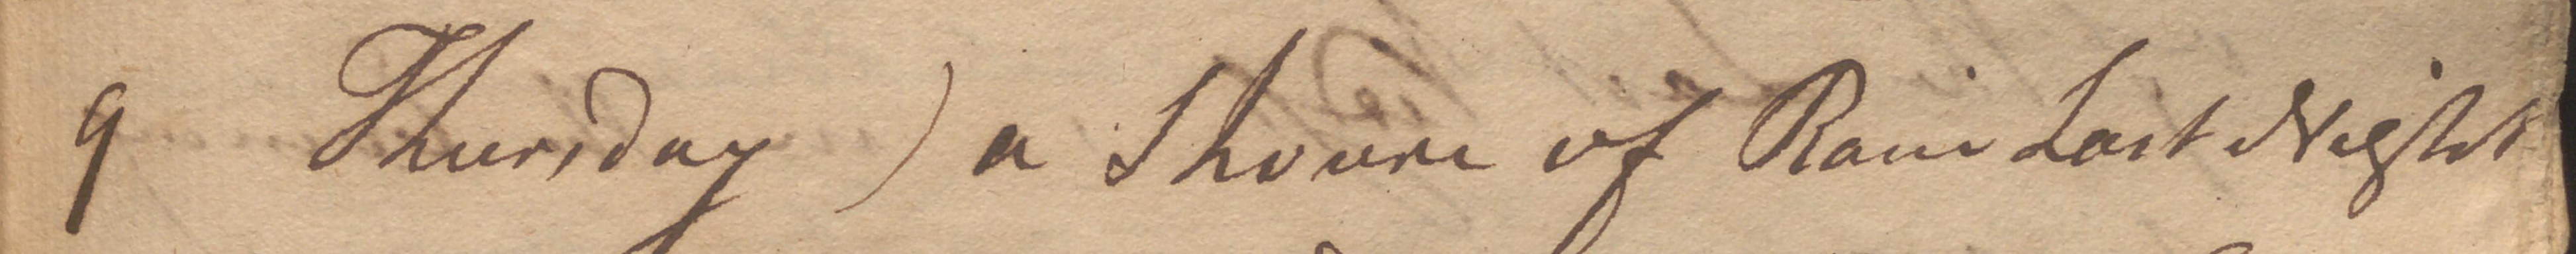9 Thursday) a Shoure of Rain Last Night
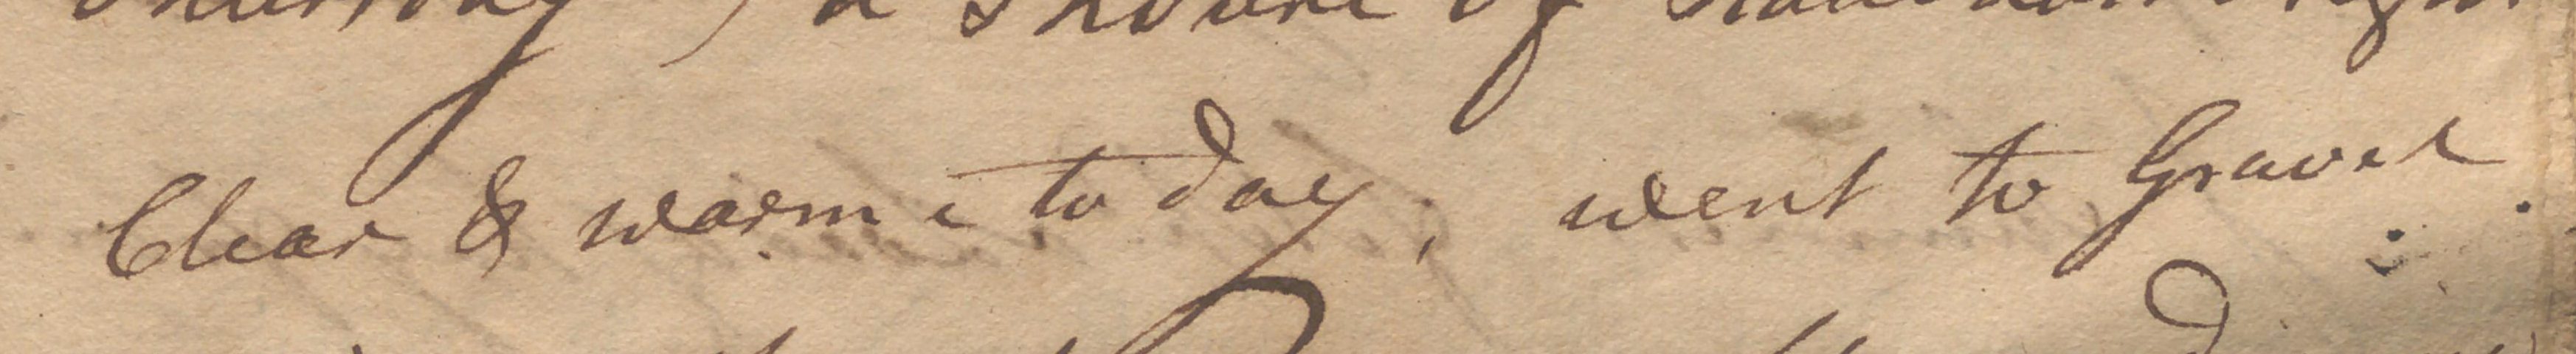Clear & warme to day. went to Gravel
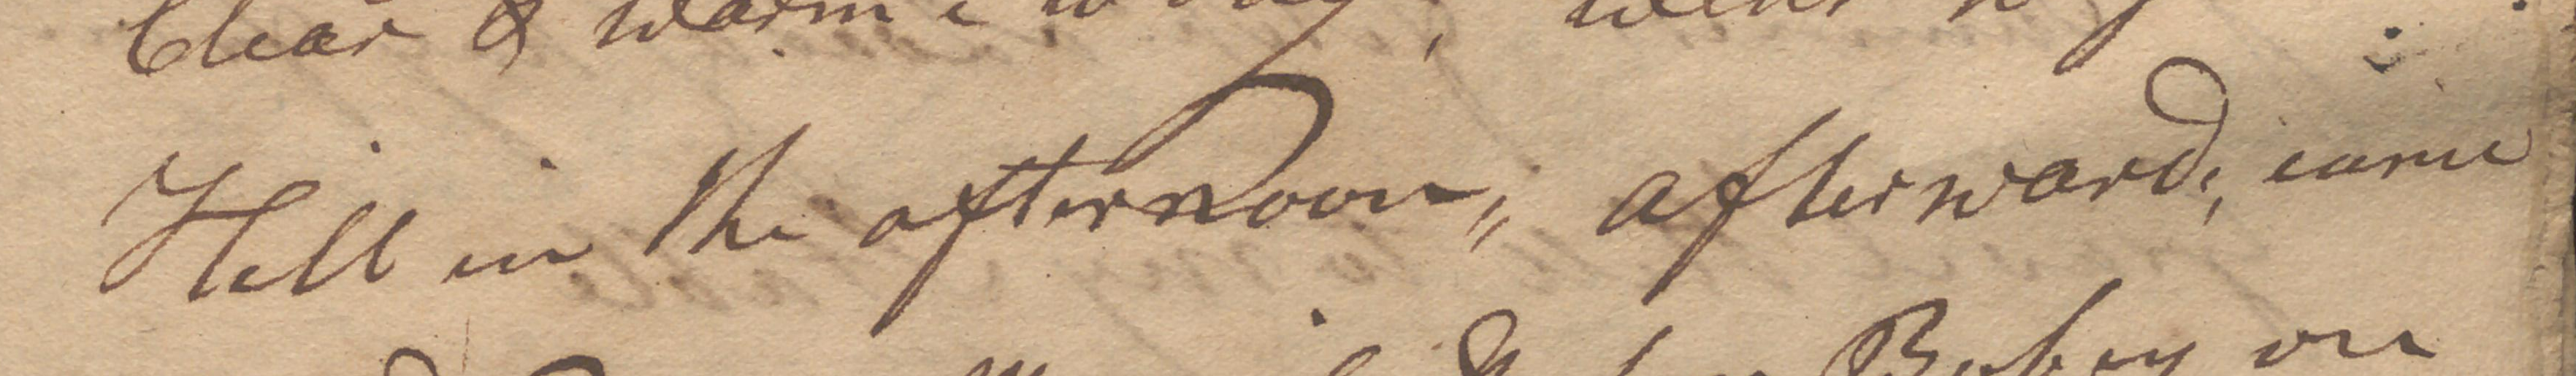Hell in the afternoon; afterward, cance
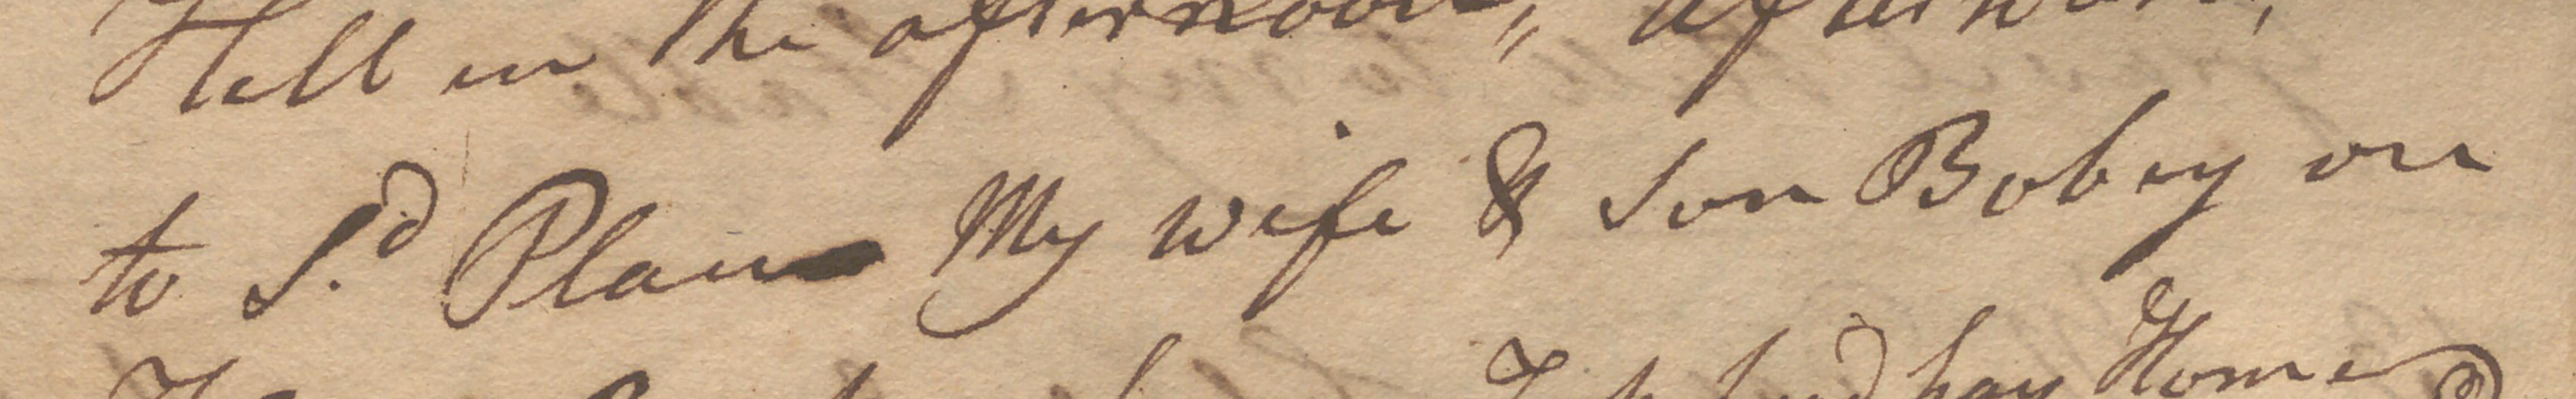to s^d. Place My wife & son Bobey on
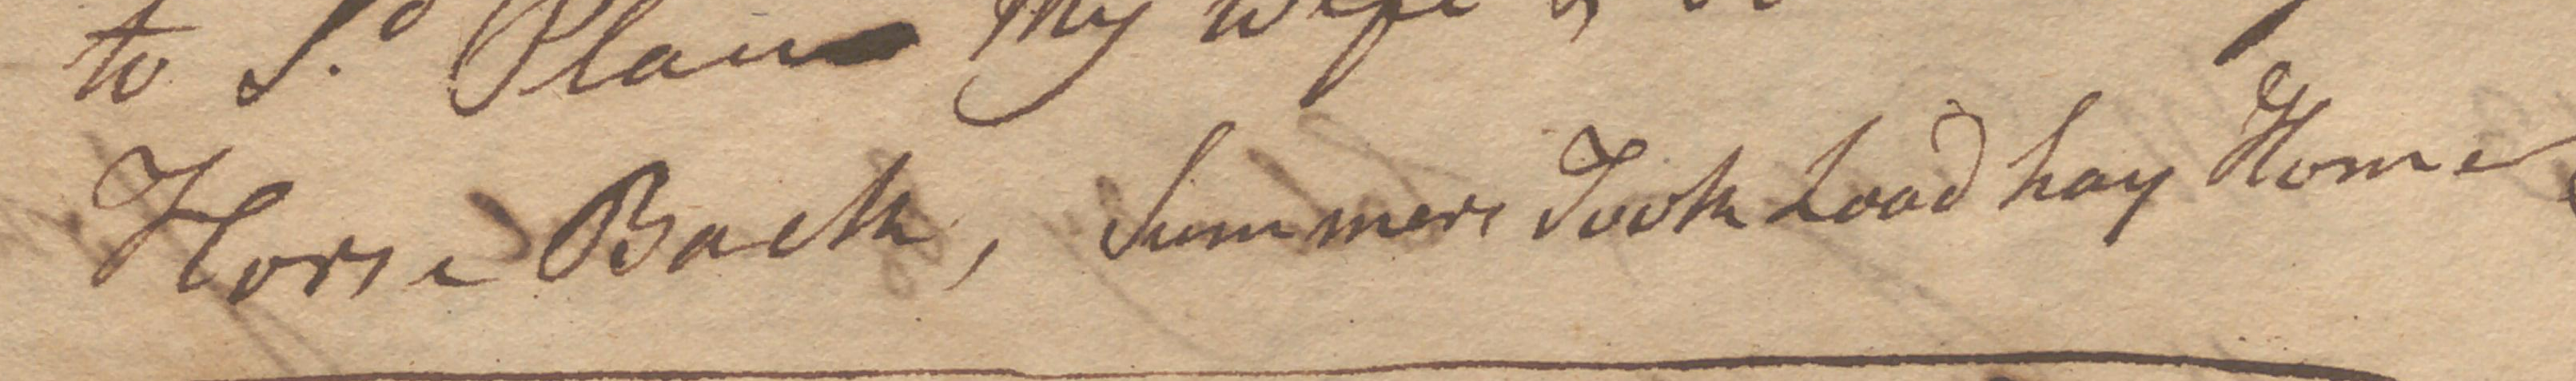Horse Back, Summers Took Load hay Home
